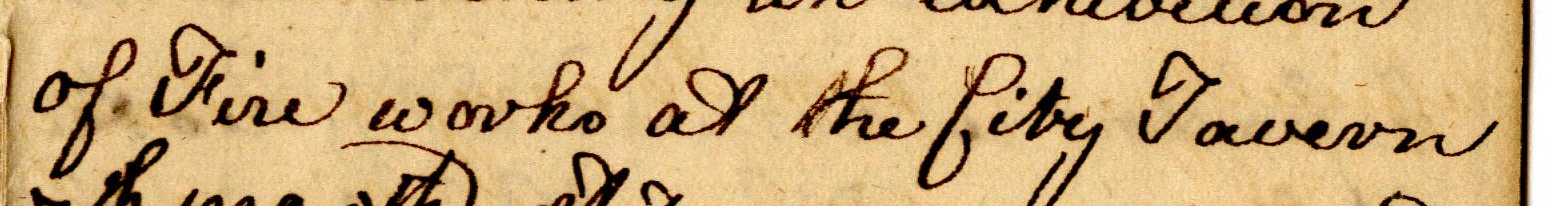of Fire works at the City Tavern
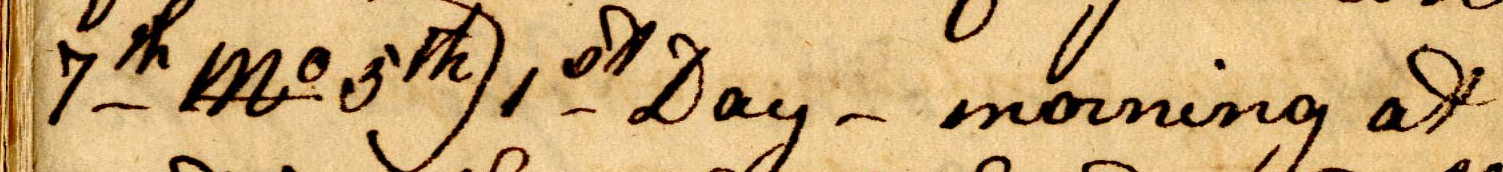7^th M^o 5^th) 1^st Day- morning at
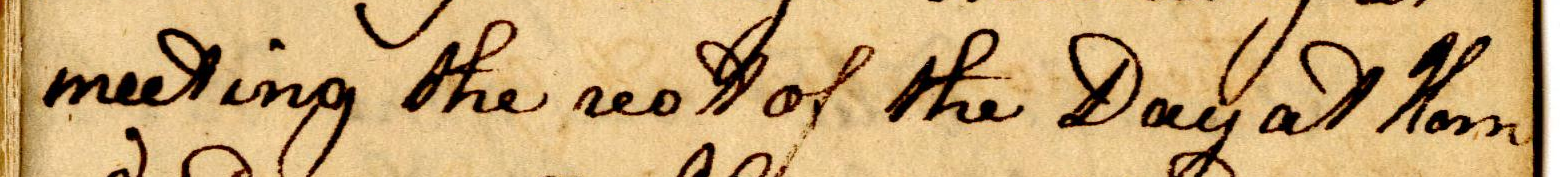meeting the rest of the Day at Hom
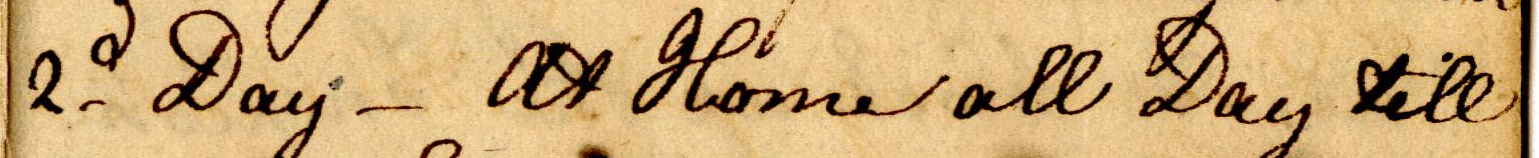2^d Day- At Home all Day till
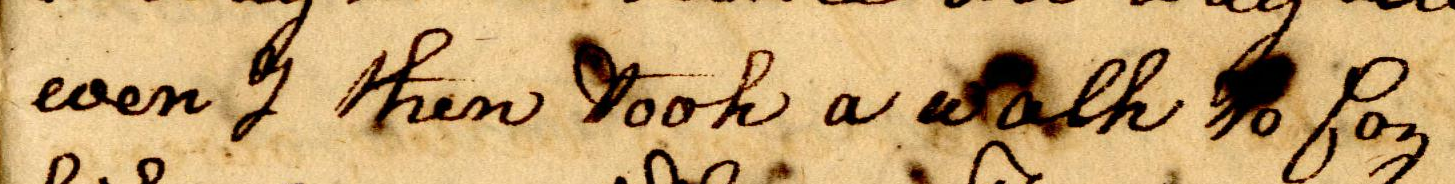even^g then took a walk to Coz
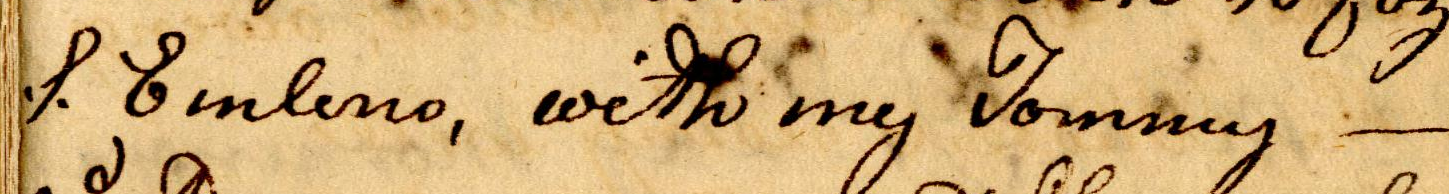S. Emlens, with my Tommy
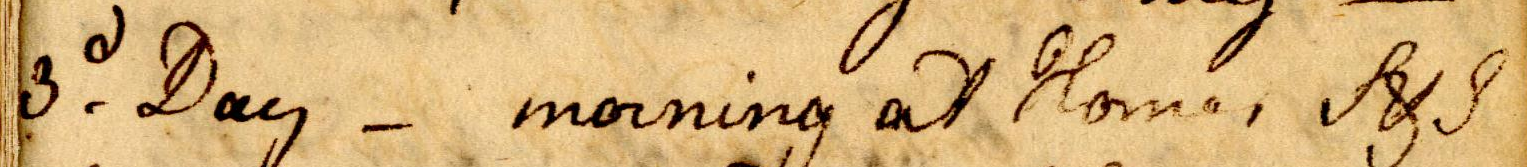3^d. Day- morning at Home, S & S
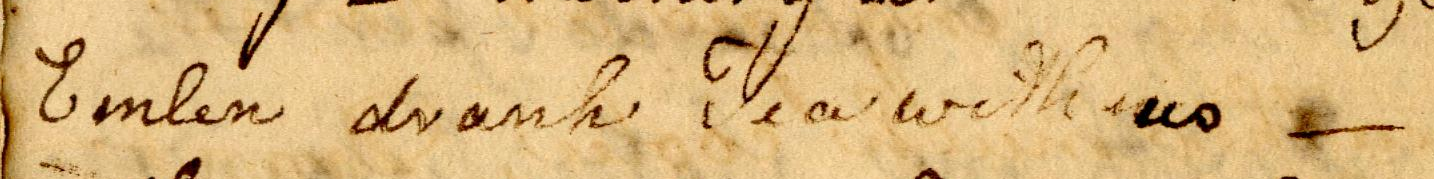Emlen drank Tea with us-
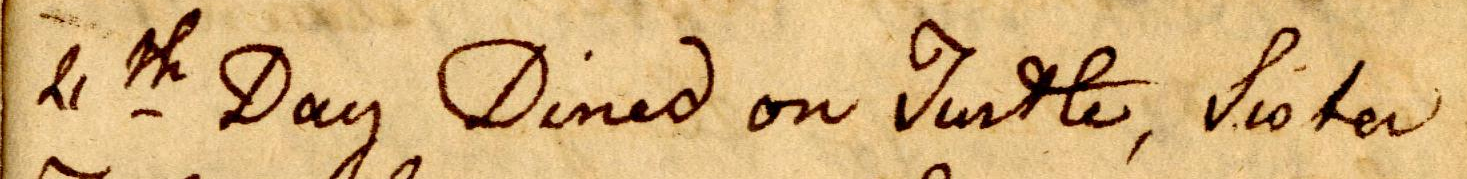4^th Day Dined on Turtle, Sister
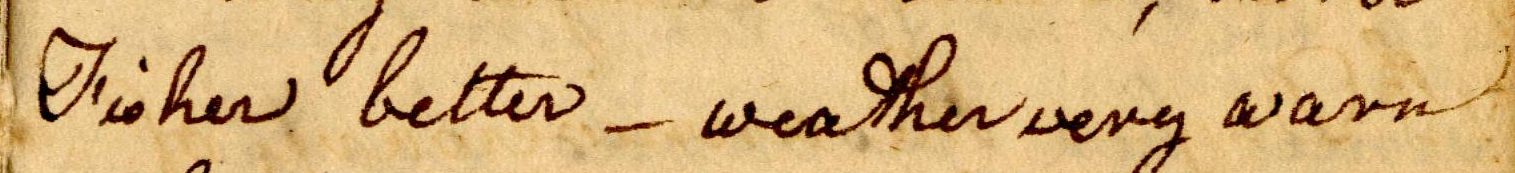Fisher better,- weather very warn
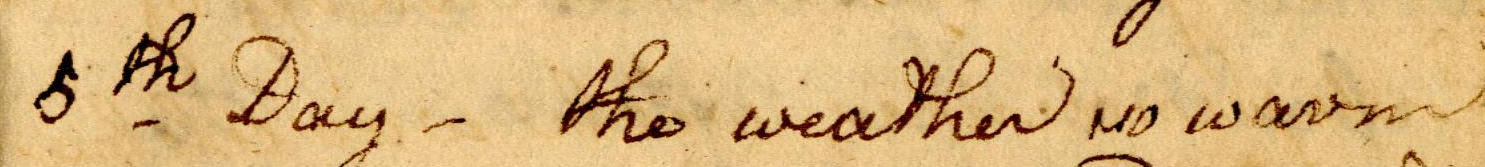5^th Day- the weather so warn
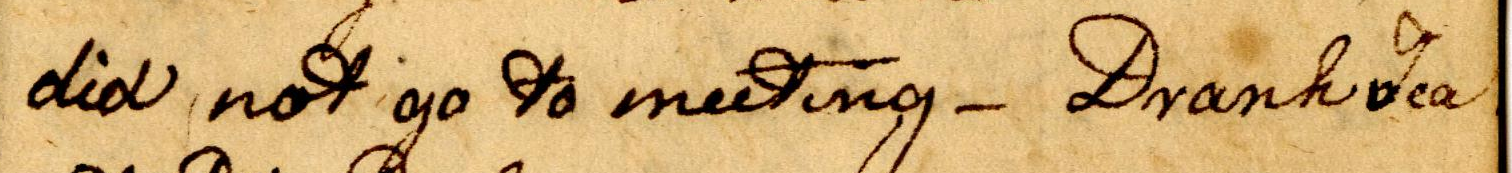did not go to meeting- Drank Tea
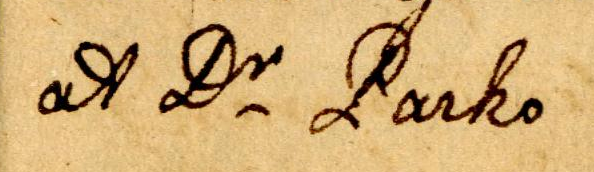at D^r- Parks
